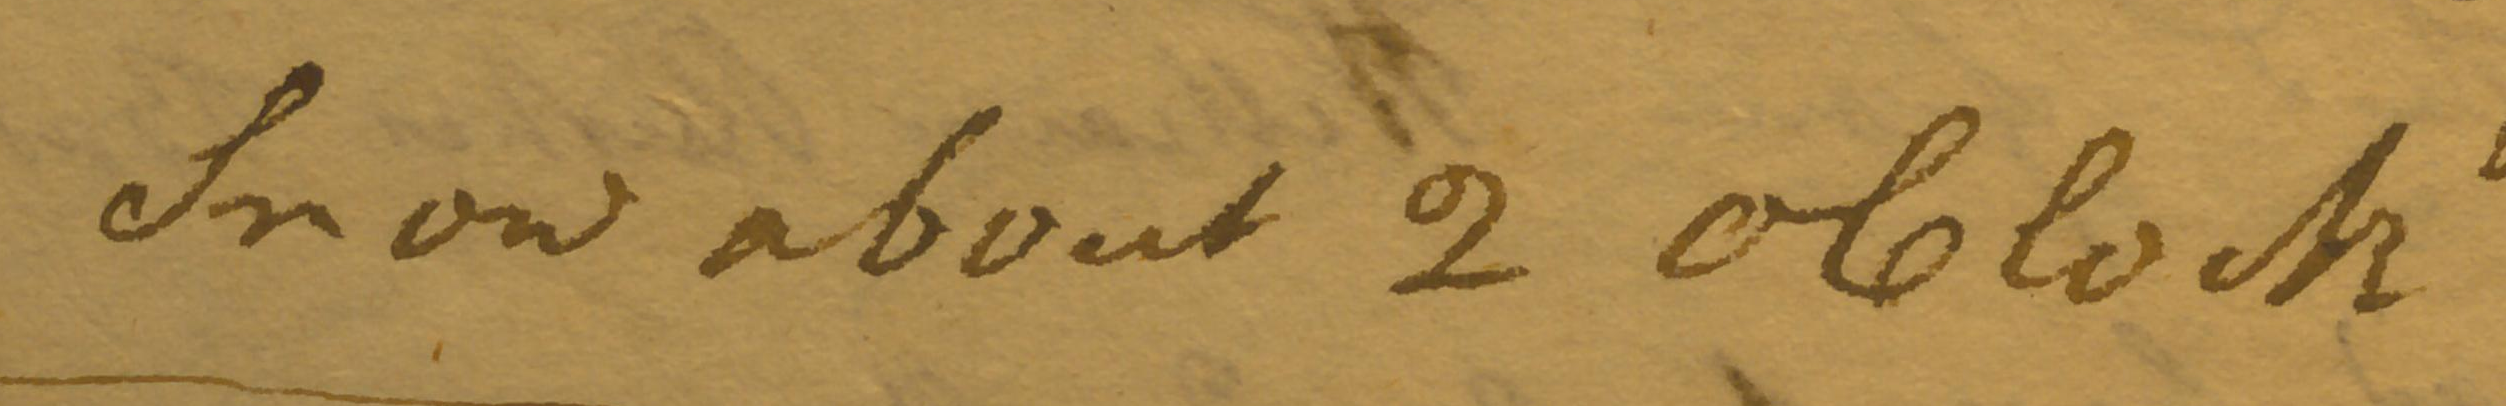Tnow about 2 oClock
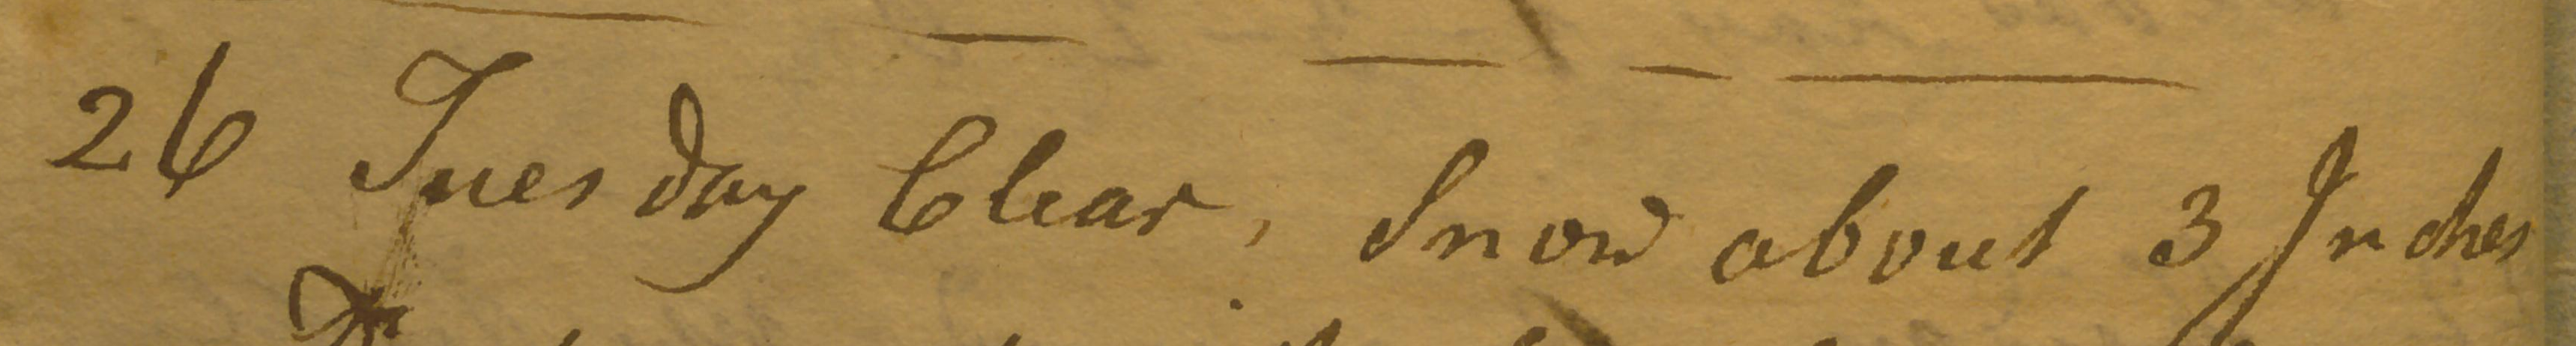26 Tuesday Clear, Snow about 3 Inches
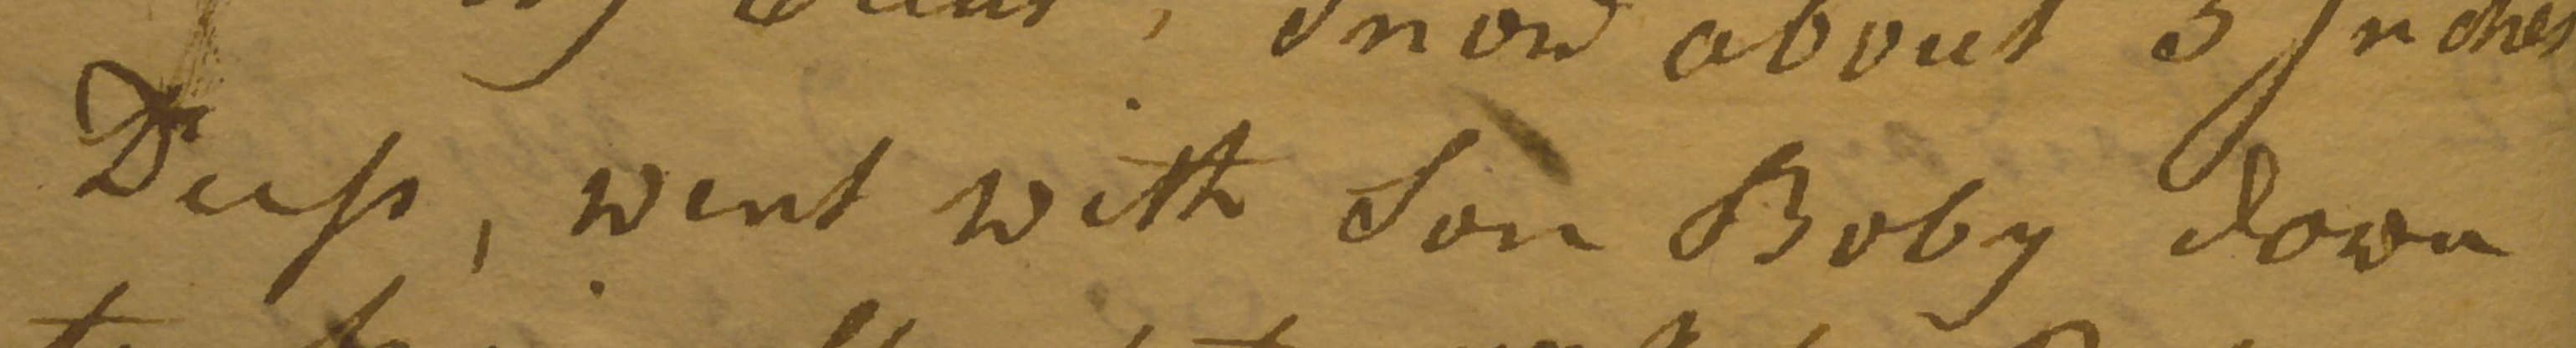Deep, went with Son Boby down
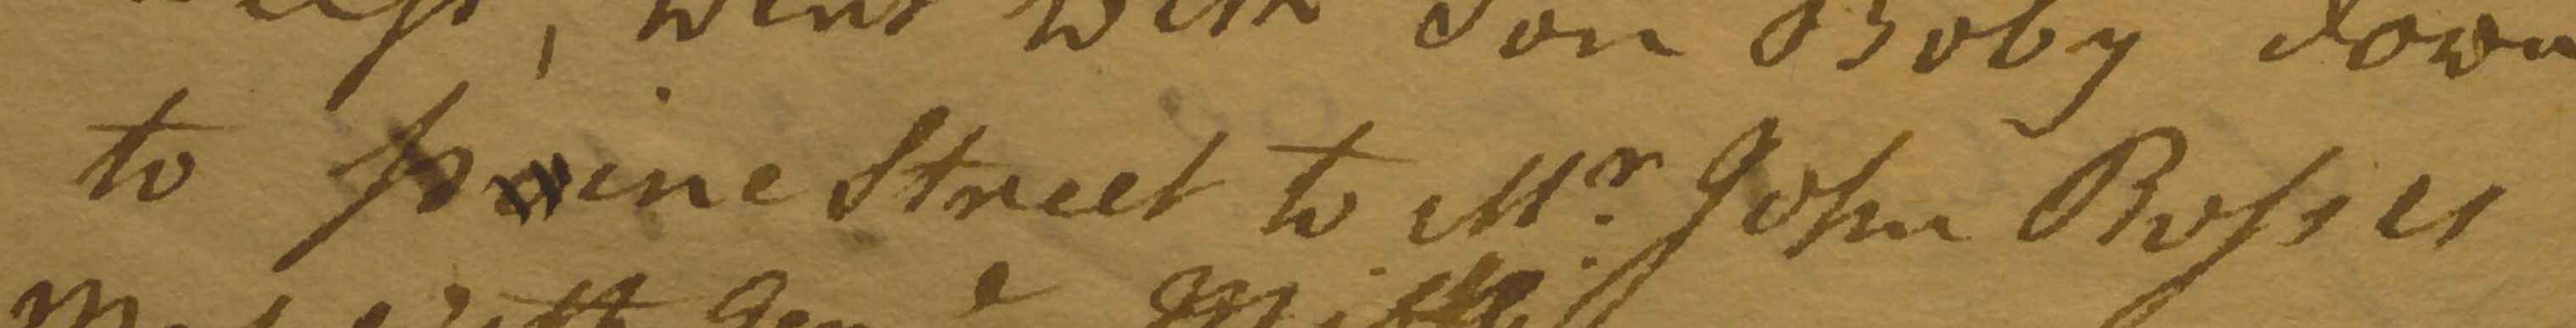to p[e]ine Street to M^r. John Rosses
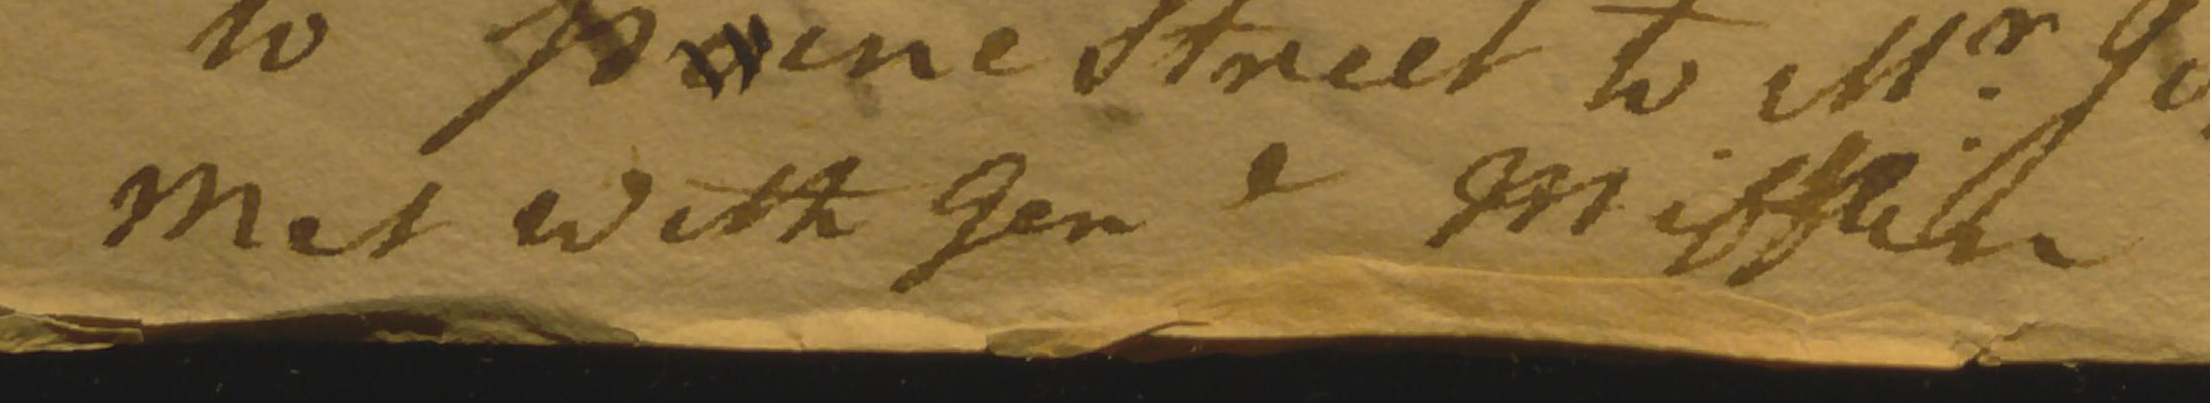Met with Gen^l Mifflin
